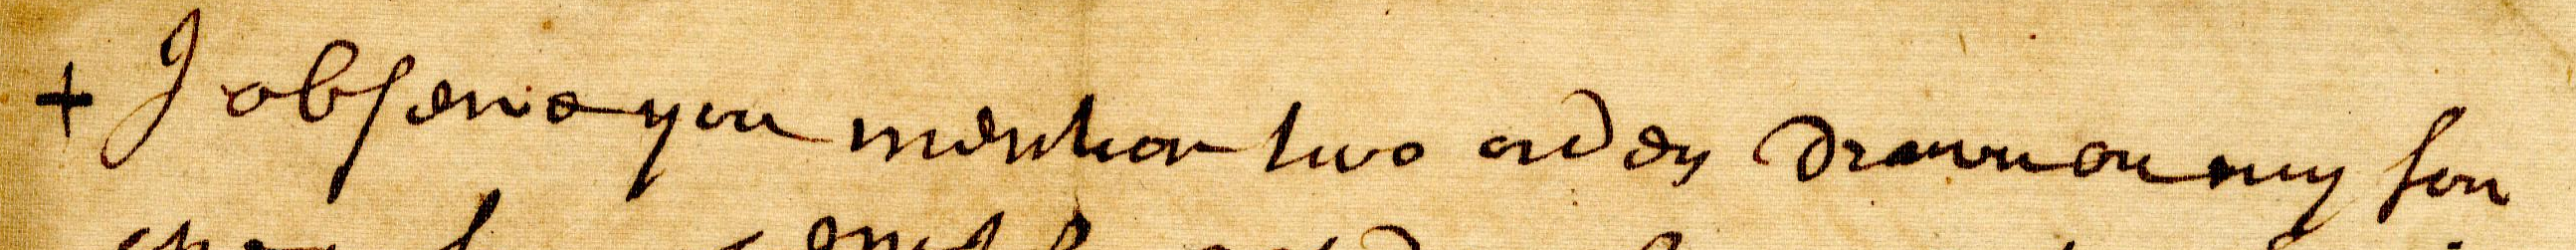+ I observe you mention two acres drawn on my son
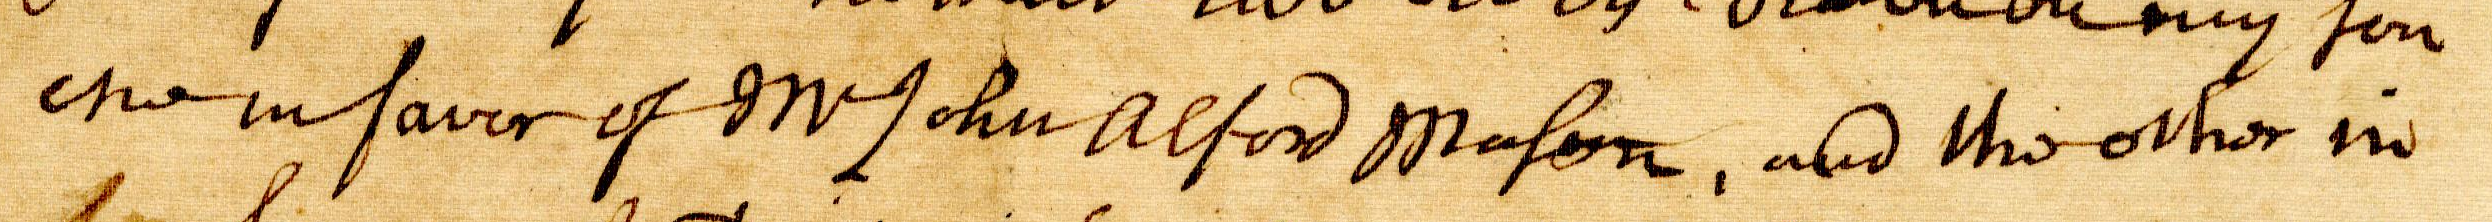and in favour of M^r John Alford Mason, and the other in
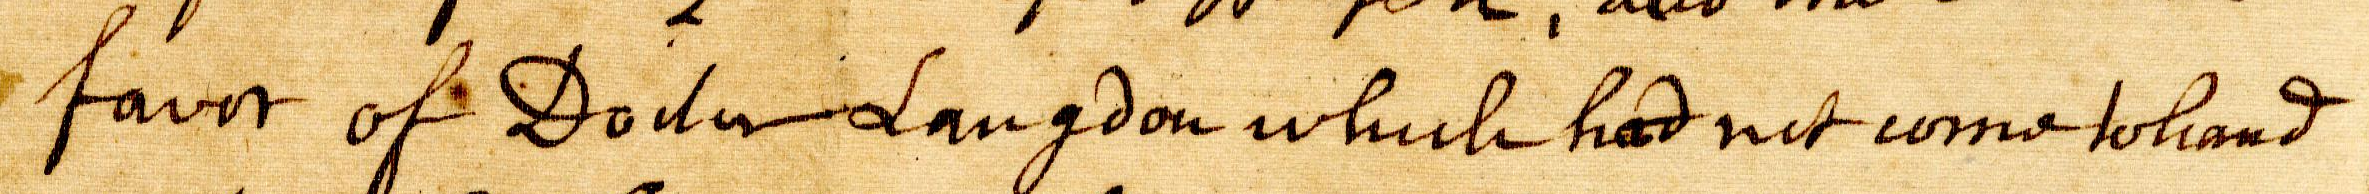favor of Doctor Langdon which had not come to hand
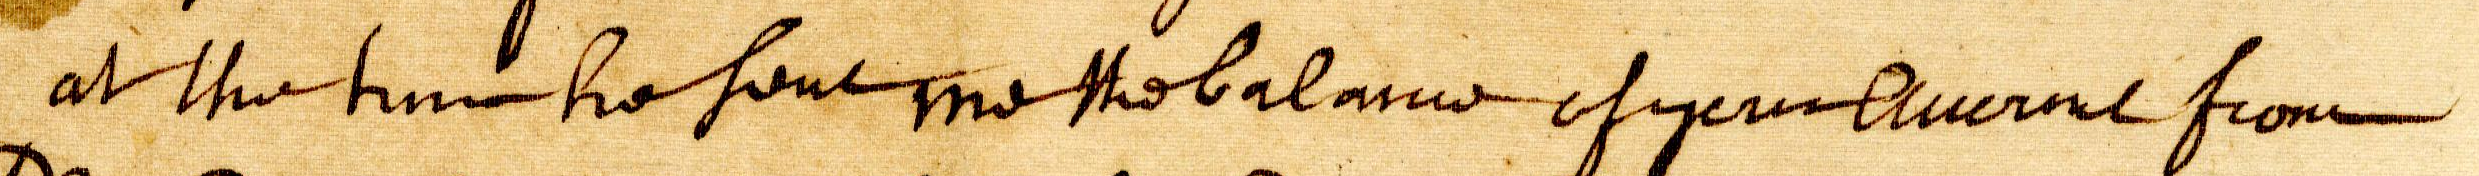at the time he sent me the balance of your Account from
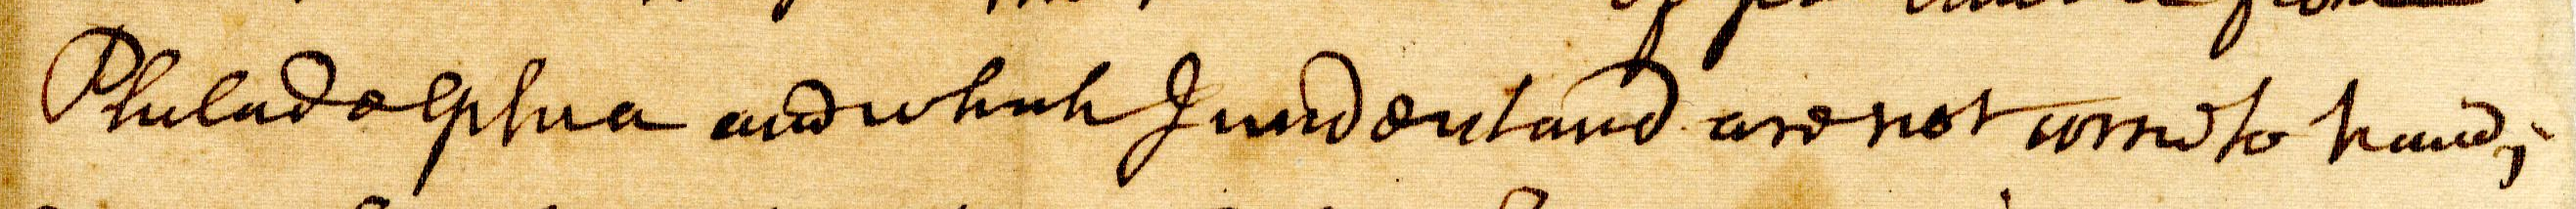Philadelphia and which I understand are not come to hand,
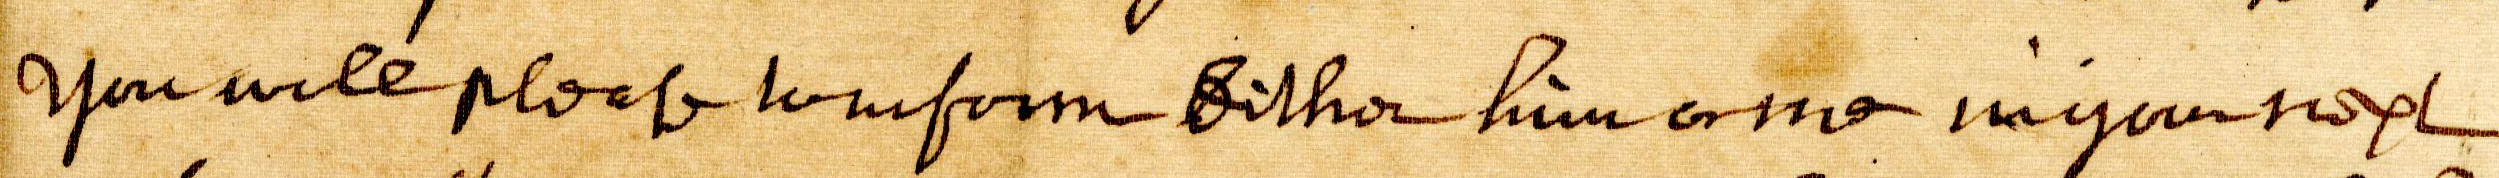You will please to inform either him or me in your next
